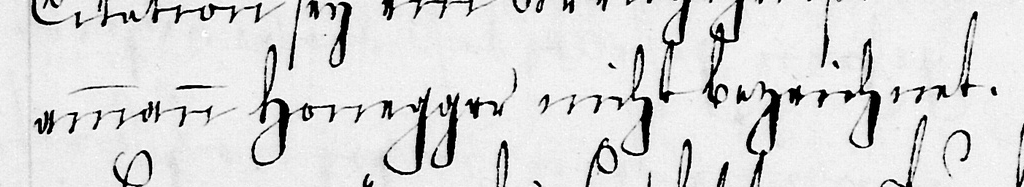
ammann Honegger nicht bezeichnet.
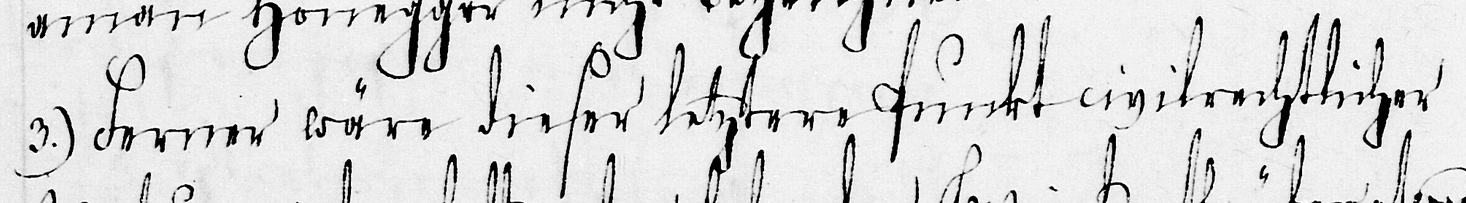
3.) Ferner wäre dieser letztere Punkt civilrechtlicher
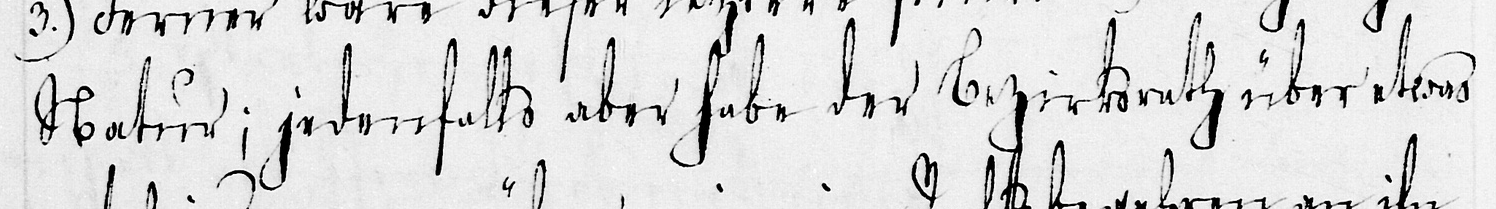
Natur; jedenfalls aber habe der Bezirksrath über etwas
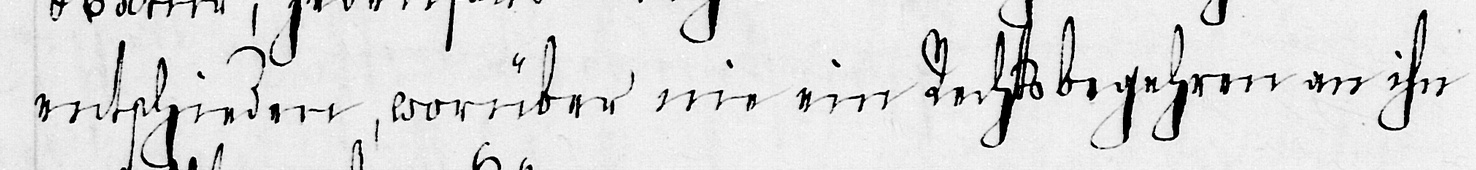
entschieden, worüber nie ein Rechtsbegehren an ihn
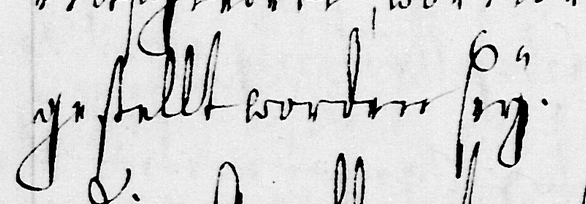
gestellt worden sey.
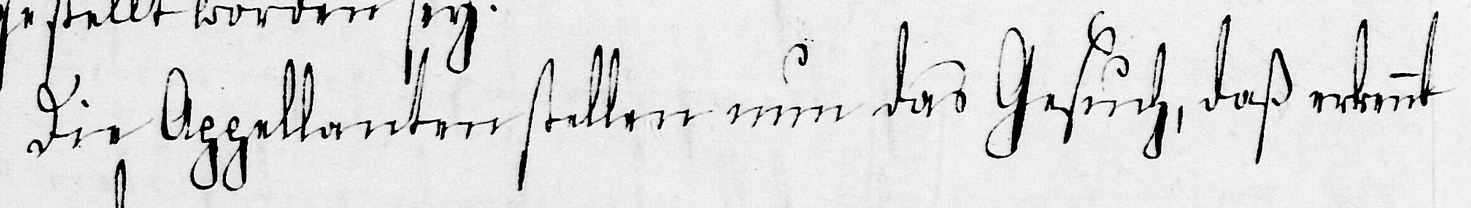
Die Appellanten stellen nun das Gesuch, daß erken¬
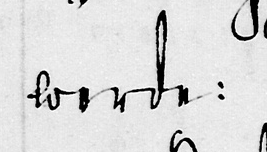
werde:
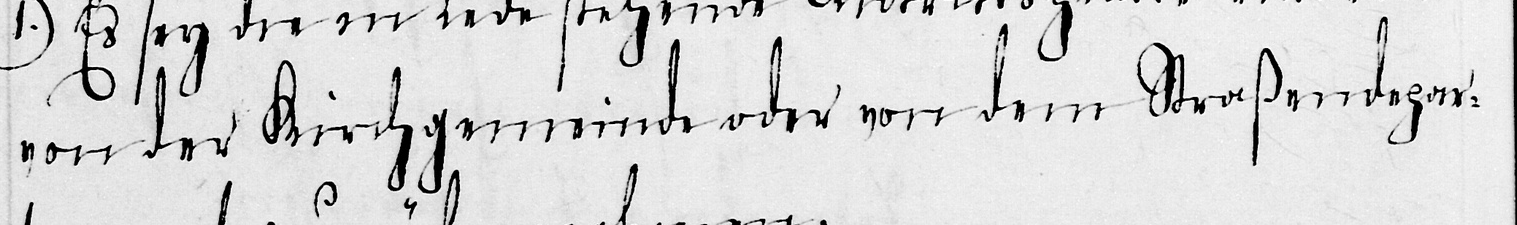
von der Kirchgemeinde oder von dem Straßendepar¬
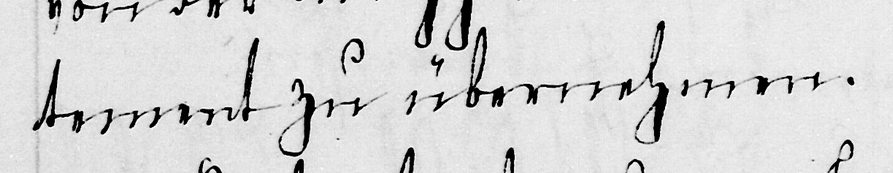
tement zu übernehmen.
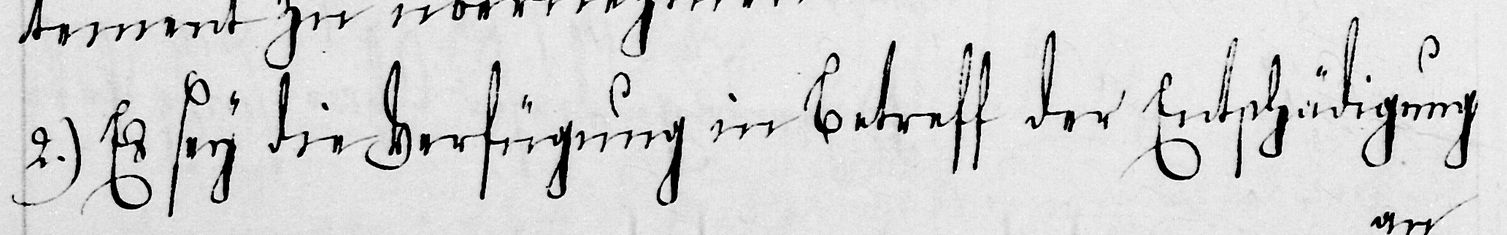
2.) Es sey die Verfügung in Betreff der Entschädigung
